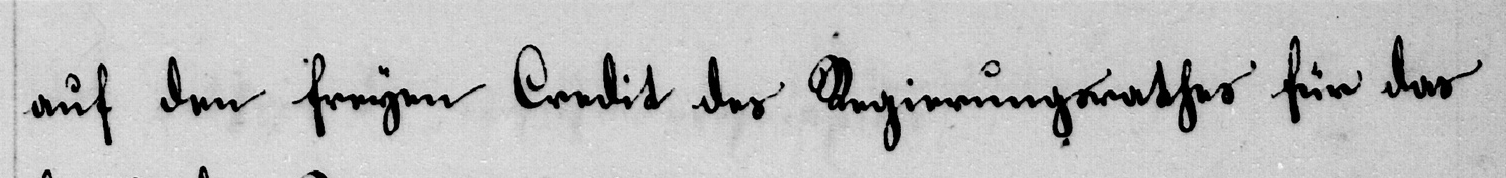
auf den freyen Credit des Regierungsrathes für das
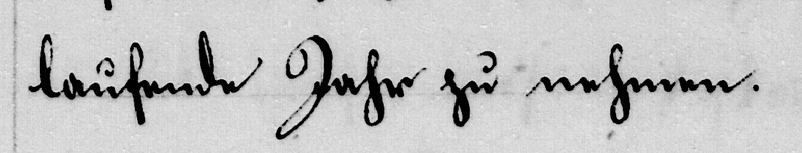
laufende Jahr zu nehmen.
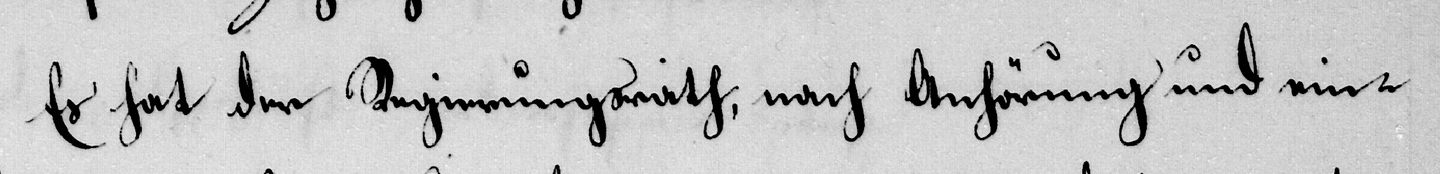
Es hat der Regierungsrath, nach Anhörung und ein¬
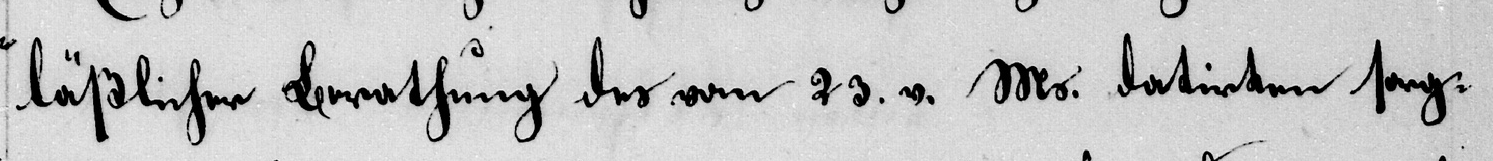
läßlicher Berathung des vom 23. v. Ms. datirten sorg¬
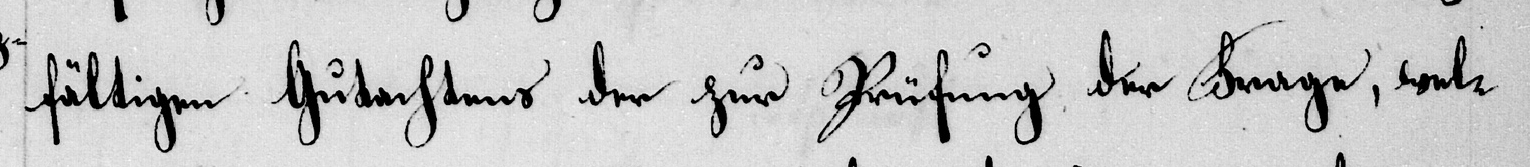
fältigen Gutachtens der zur Prüfung der Fragen, wel¬
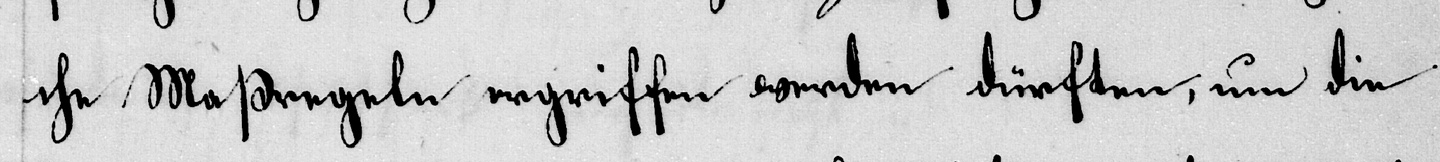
che Maßregeln ergriffen werden dürften, um die
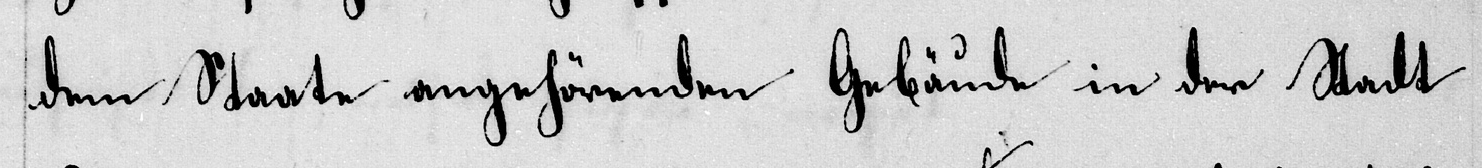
dem Staate angehörenden Gebäude in der Stadt
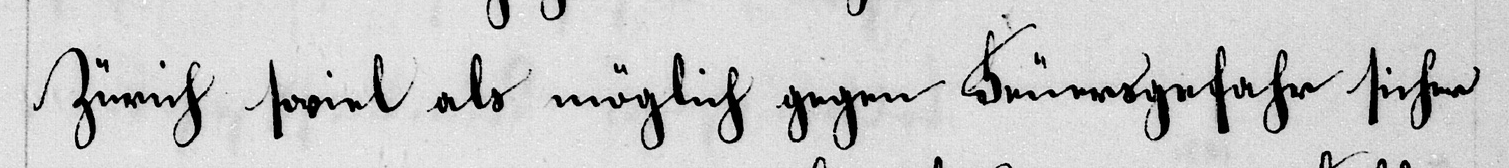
Zürich soviel als möglich gegen Feuersgefahr sicher
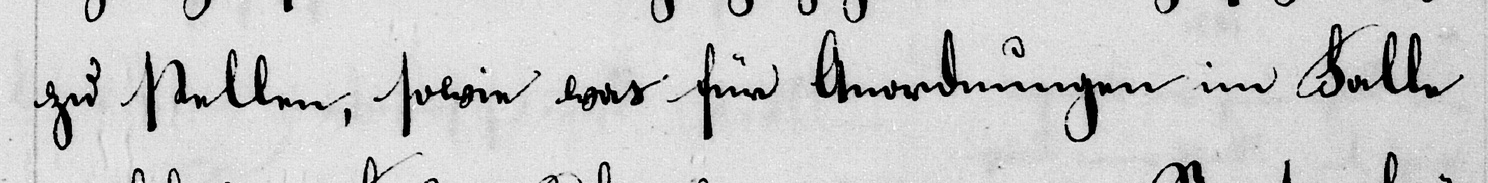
zu stellen, sowie was für Anordnungen im Falle
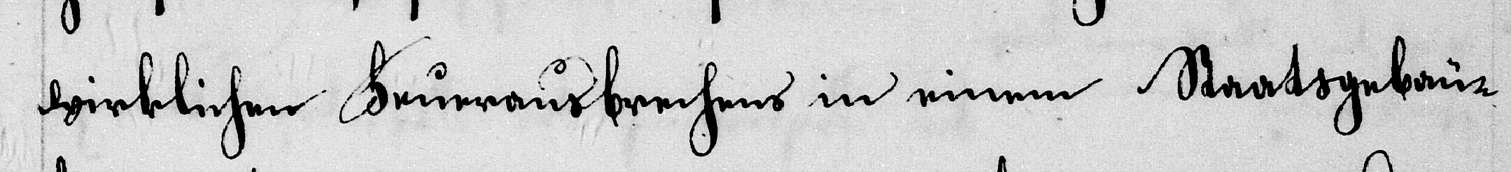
wirklichen Feuerausbruches in einem Staatsgebäu¬
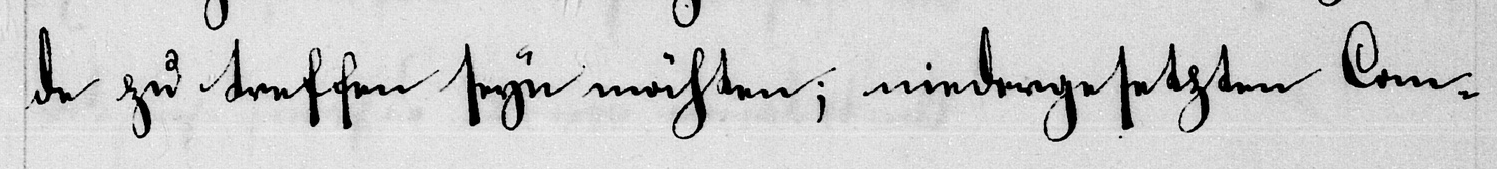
de zu treffen seyn möchten; niedergesetzten Com¬
